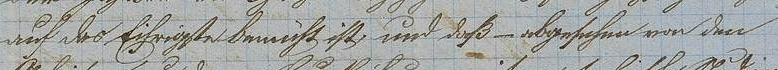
auf das Eifrigste bemüht ist, und daß – abgesehen von den
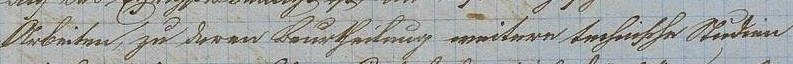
Arbeiten, zu deren Beurtheilung weitere technische Studien
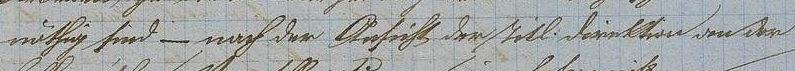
nöthig sind – nach der Ansicht der Titl. Direktion von der
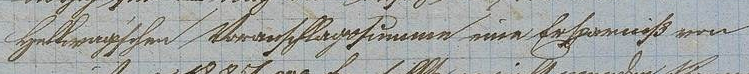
Hellwag'schen Voranschlagssumme eine Ersparniß von
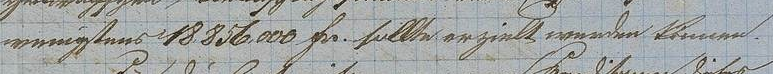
wenigstens 18.856.000 Fr. sollte erzielt werden können.
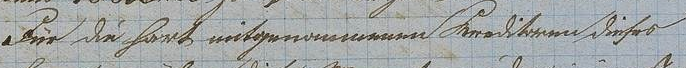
Für die hart mitgenommenen Kreditoren dieses
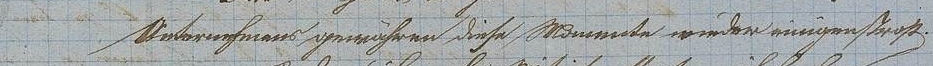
Unternehmens gewähren diese Momente wieder einigen Trost.
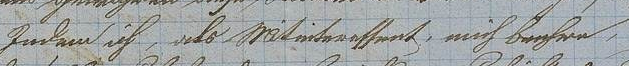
Indem ich, als Mitinteressent, mich beehre,
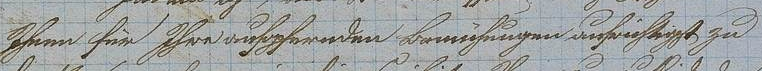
Ihnen für Ihre aufopfernden Bemühungen aufrichtigst zu
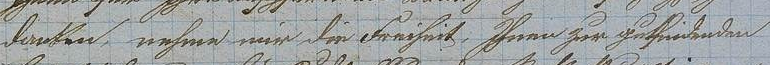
danken, nehme mir die Freiheit, Ihnen zur gutfindenden
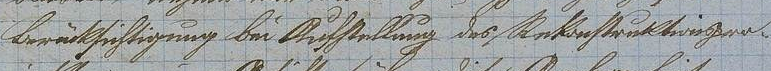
Berücksichtigung bei Aufstellung des Rekonstruktionspro-
